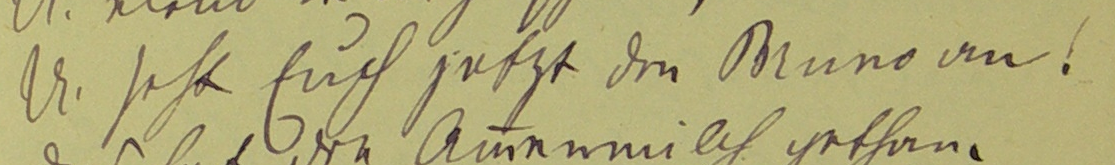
U. seht Euch jetzt den Bruno an !
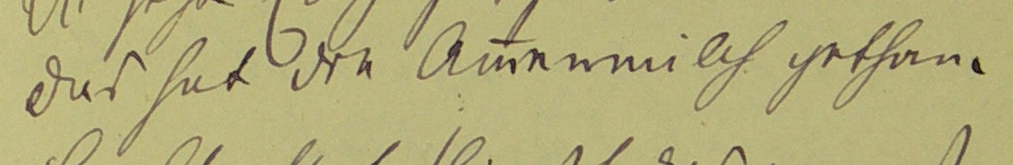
Das hat die Amenmilch gethan.
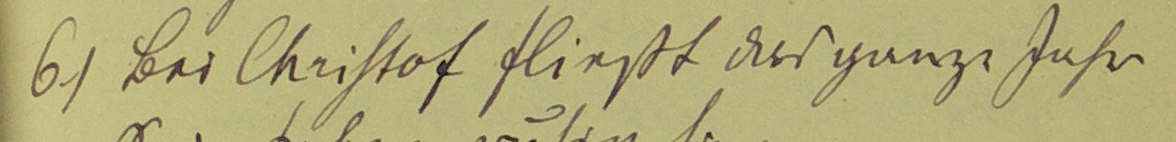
6) Bei Christof fließt das ganze Jahr
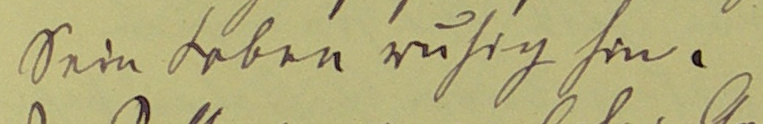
Sein Leben ruhig hin.
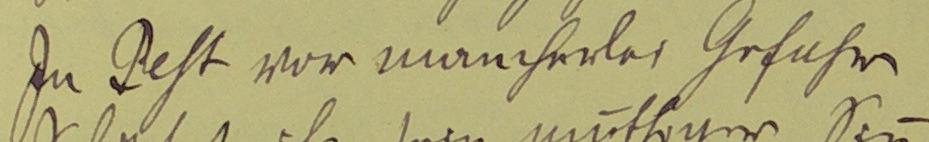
In Rest vor mancherlei Gefahr
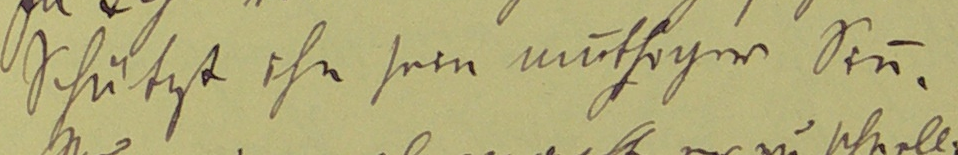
Schützt ihn sein muthiger Sinn.
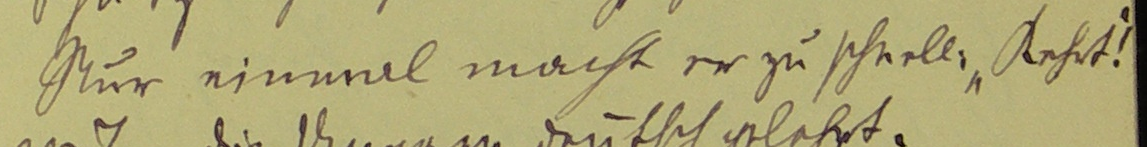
Nur einmal macht er zu schnell "Kehrt" !
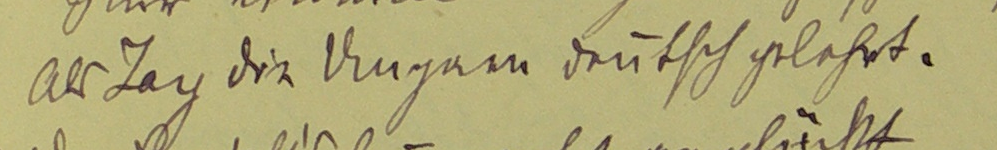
Als Lay die Ungarn deutsch gelehrt.
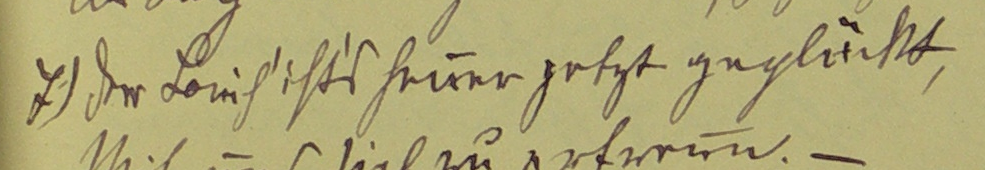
7) Dem Lous ist's heuer jetzt geglückt
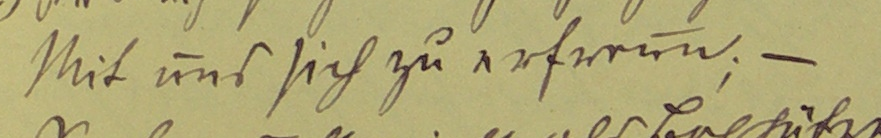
Mit uns sich zu erfreuen. -
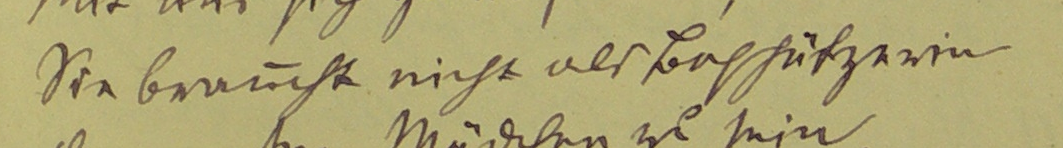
Sie braucht nicht als Beschützerin
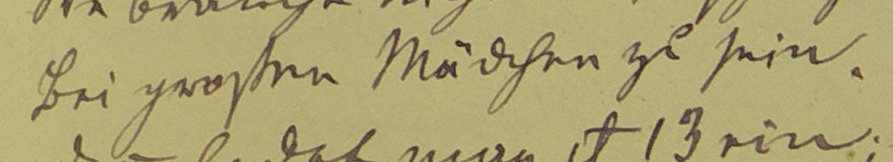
Bei großen Mädchen zu sein.
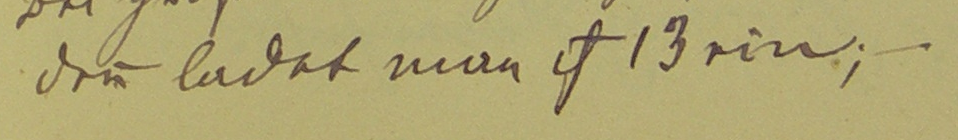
Die ladet man t 13 ein;
